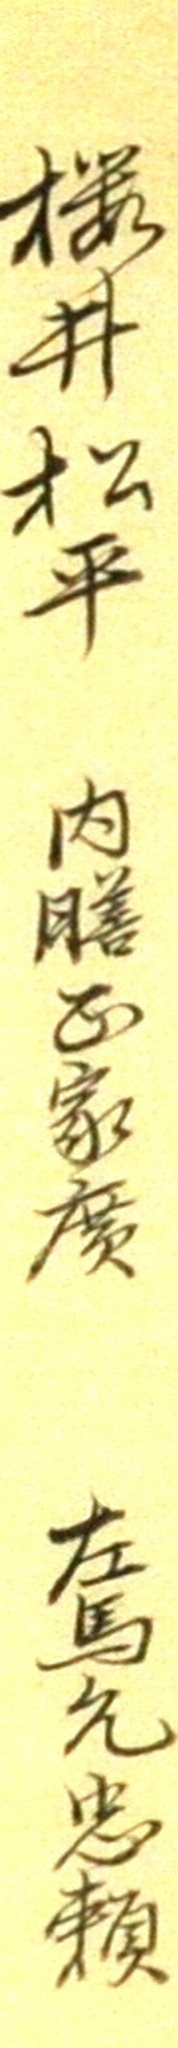桜井松平内膳正家広左馬允忠頼

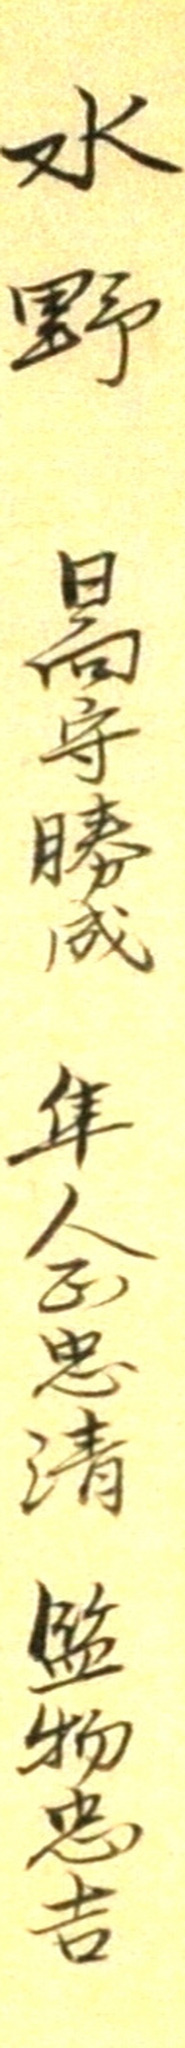水野日向守勝成隼人正忠清監物忠吉
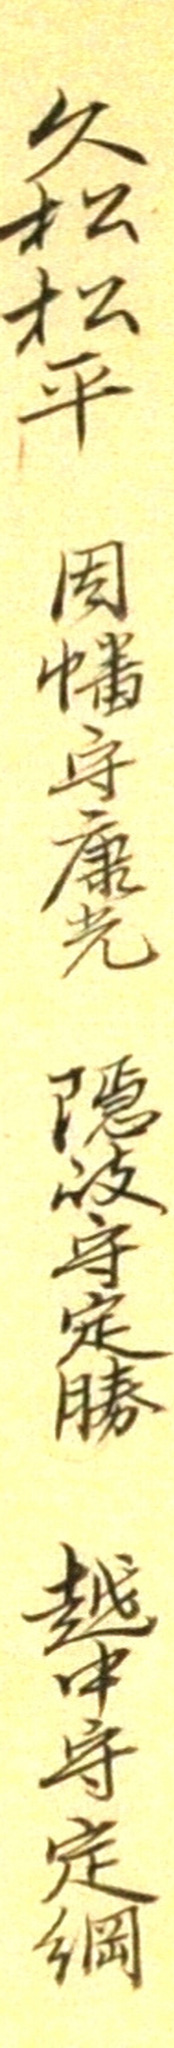久松松平因幡守康光隠岐守定勝越中守定綱
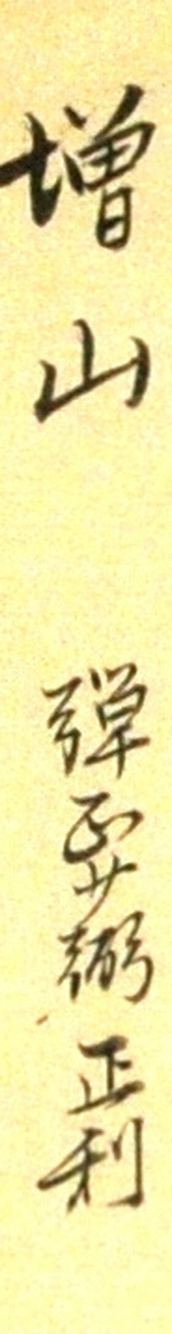増山弾正少弼正利

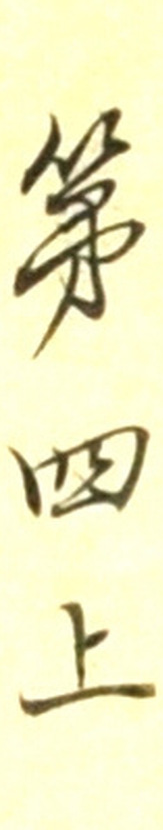第四上
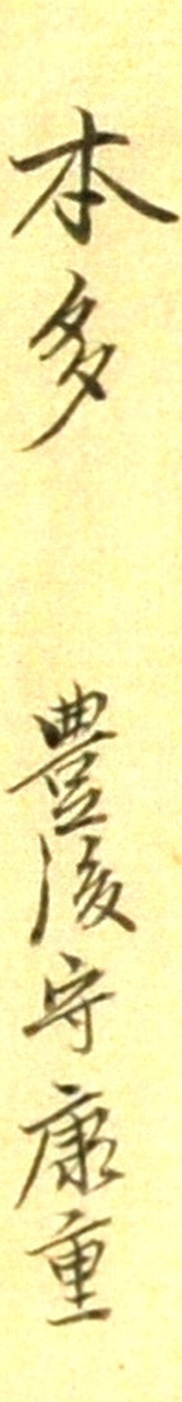本多豊後守康重
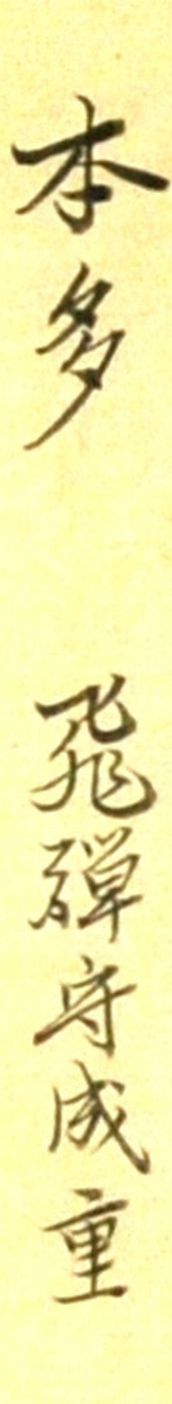本多飛騨守成重

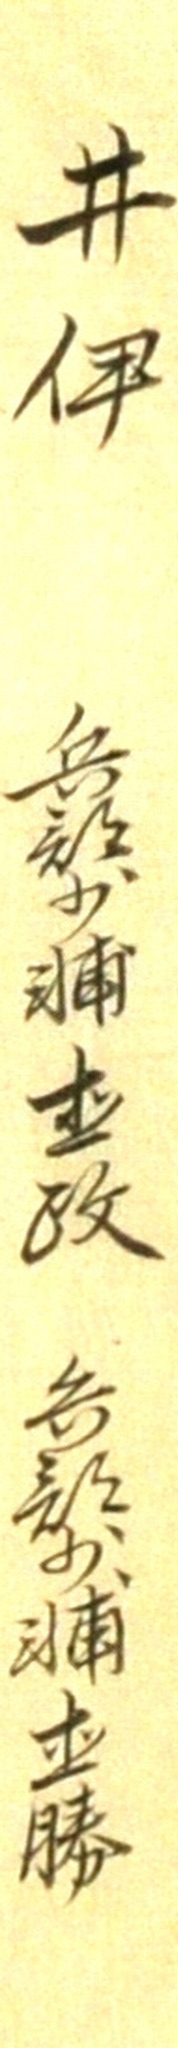井伊兵部少輔直政兵部少輔直勝
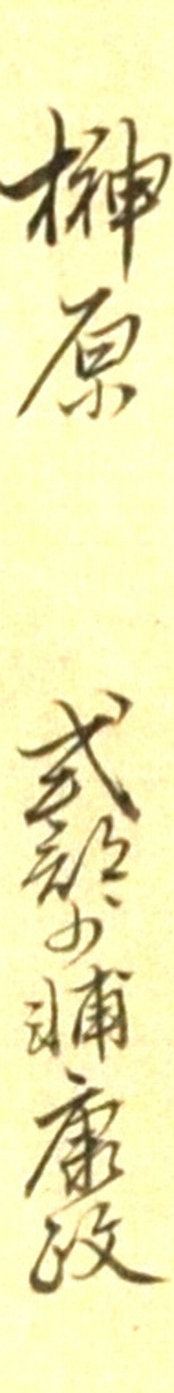榊原式部少輔康政
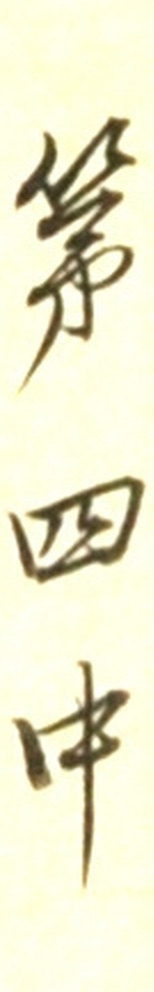第四中

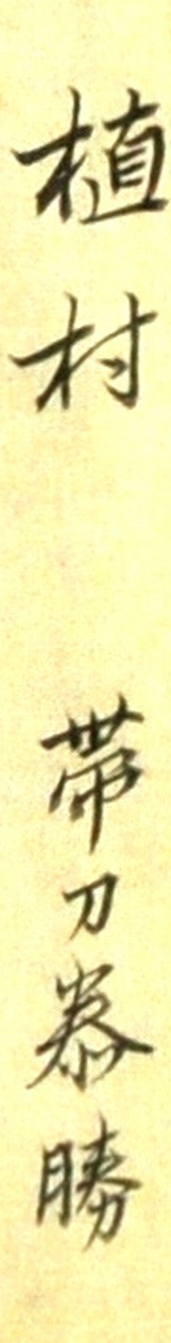植村帯刀泰勝
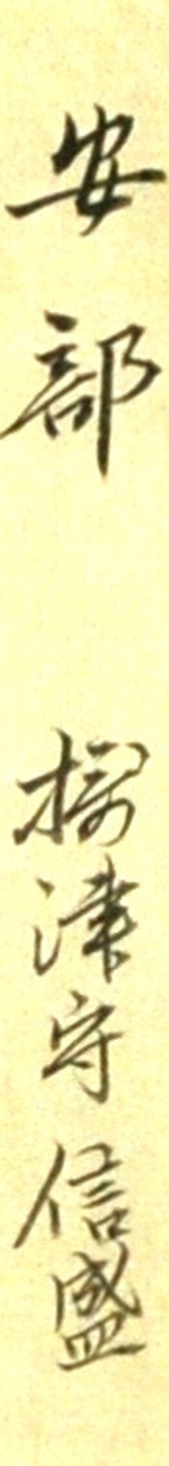安部摂津守信盛
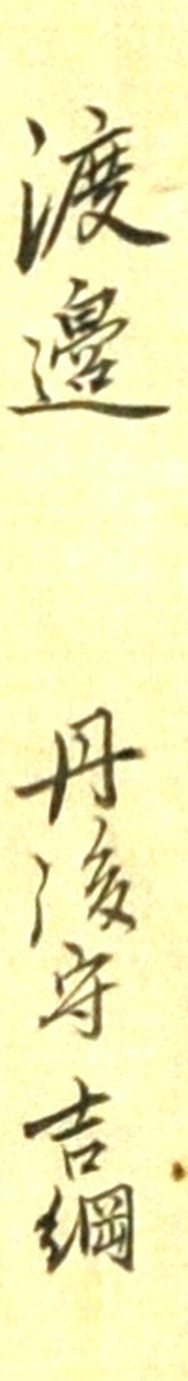渡辺丹後守吉綱
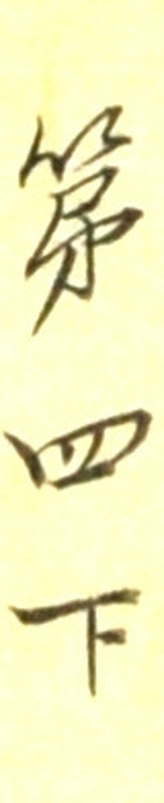第四下
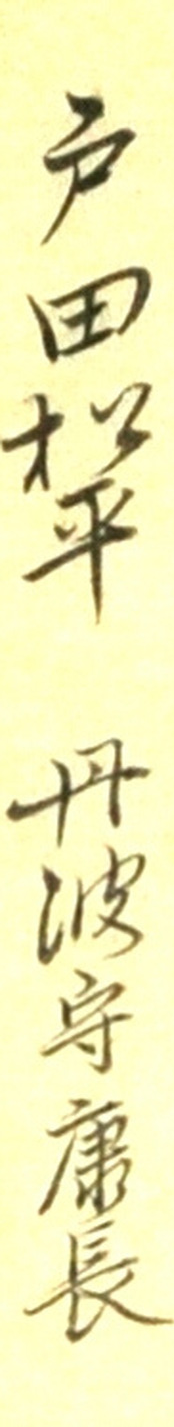戸田松平丹波守康長
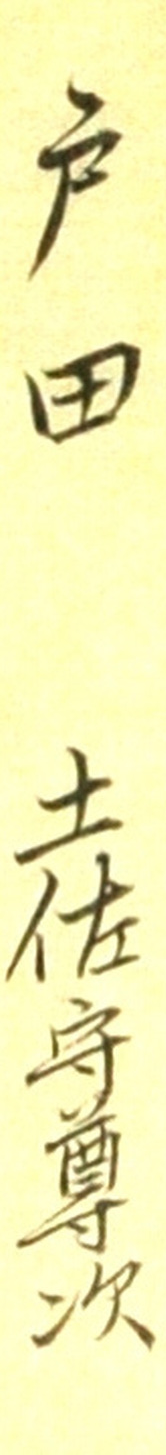戸田土佐守尊次
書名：藩翰譜（一）
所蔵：伊那市立高遠町図書館・合同会社AMANE
